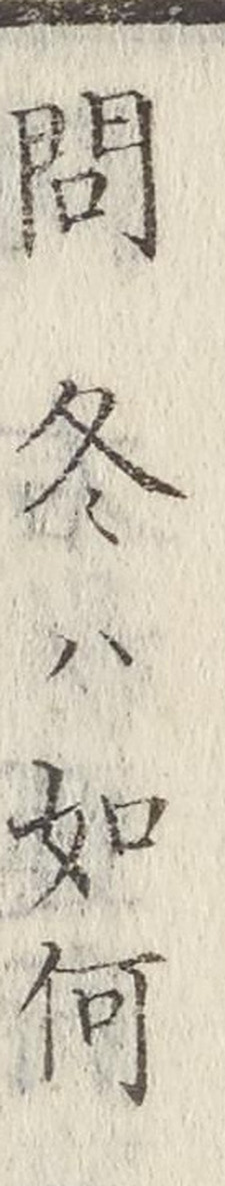問冬ハ如何
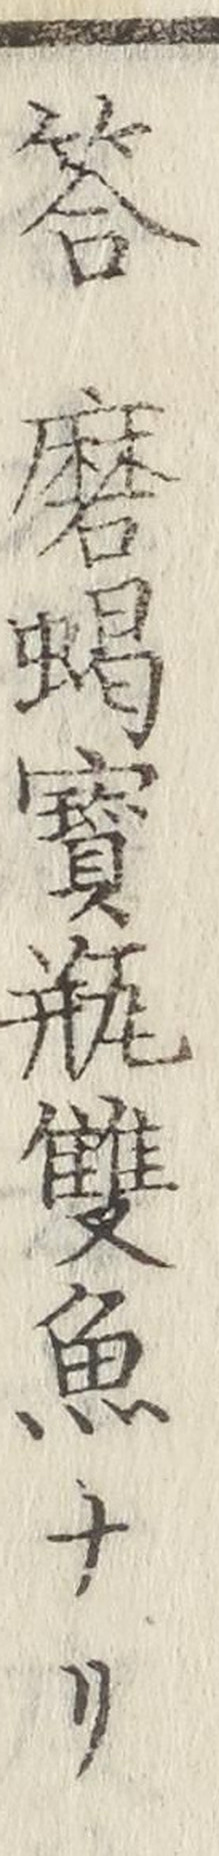答磨蝎宝瓶双魚ナリ
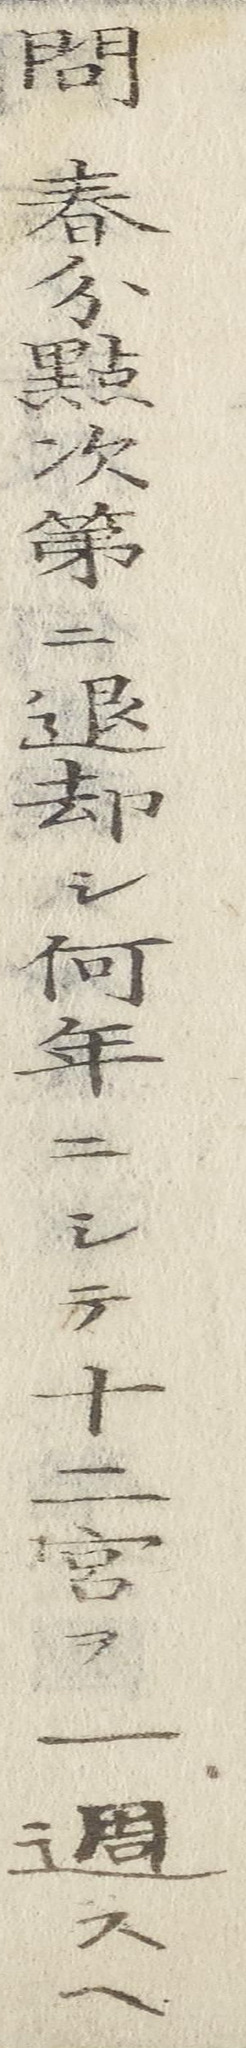問春分点次第ニ退却シ何年ニシテ十二宮ヲ一週スヘ

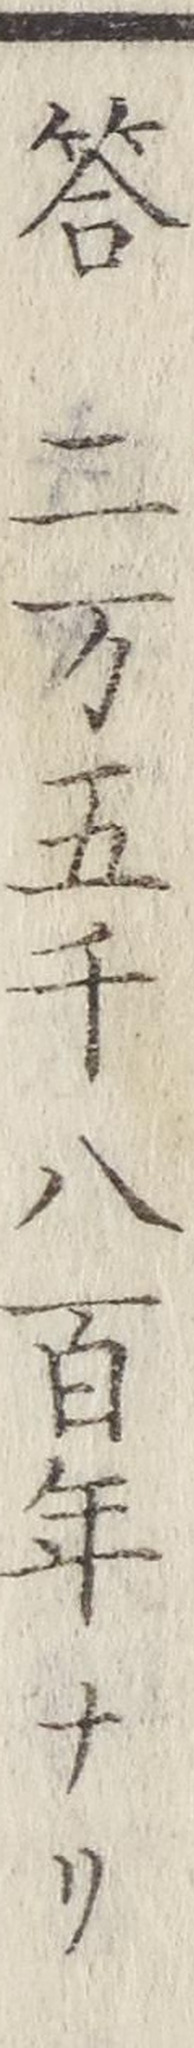答二万五千八百年ナリ
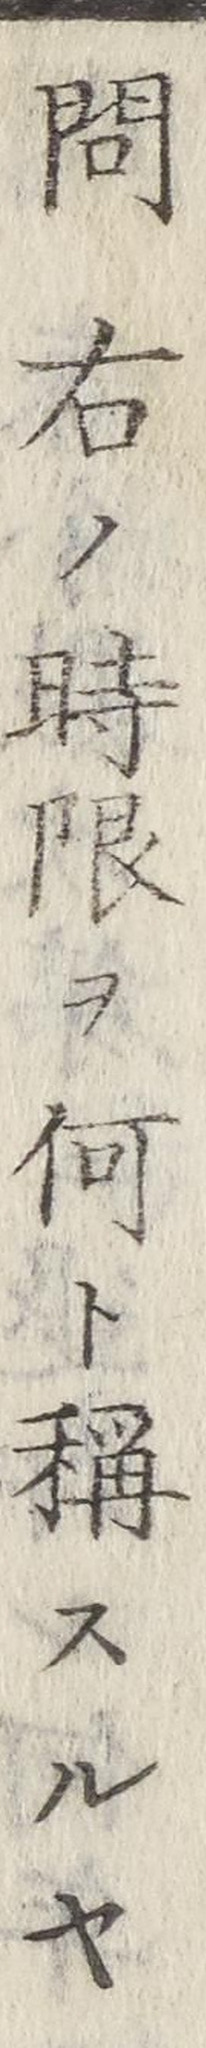問右ノ時限ヲ何ト称スルヤ
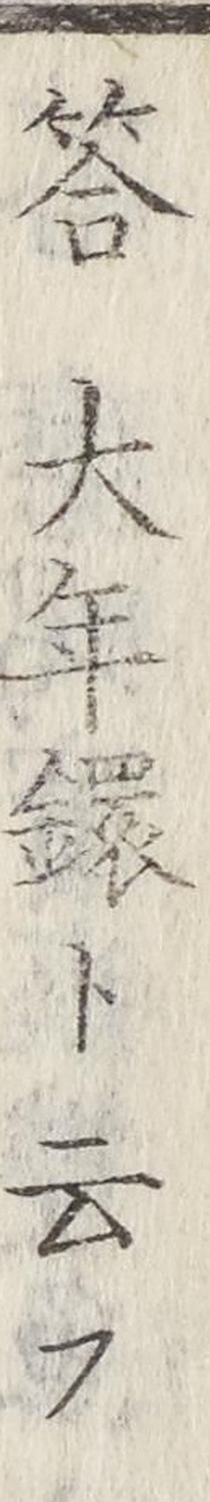答大年鐶ト云フ
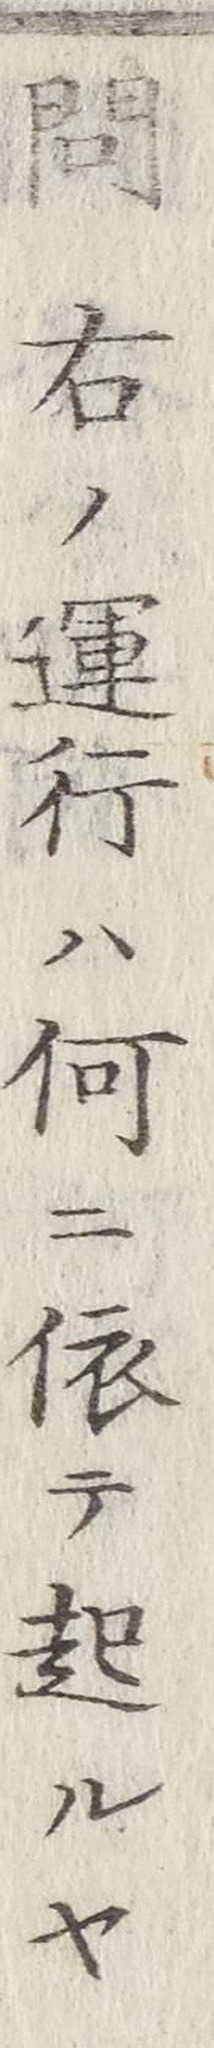問右ノ運行ハ何ニ依テ起ルヤ
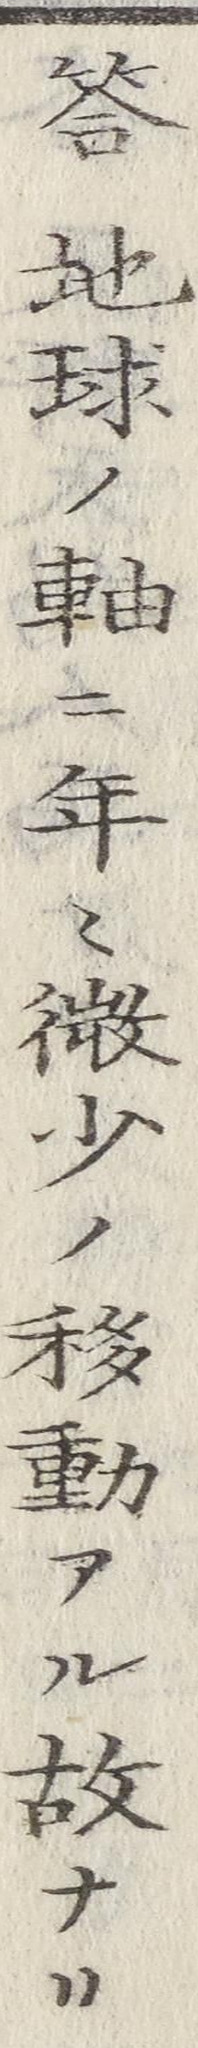答地球ノ軸ニ年〻微少ノ移動アル故ナリ
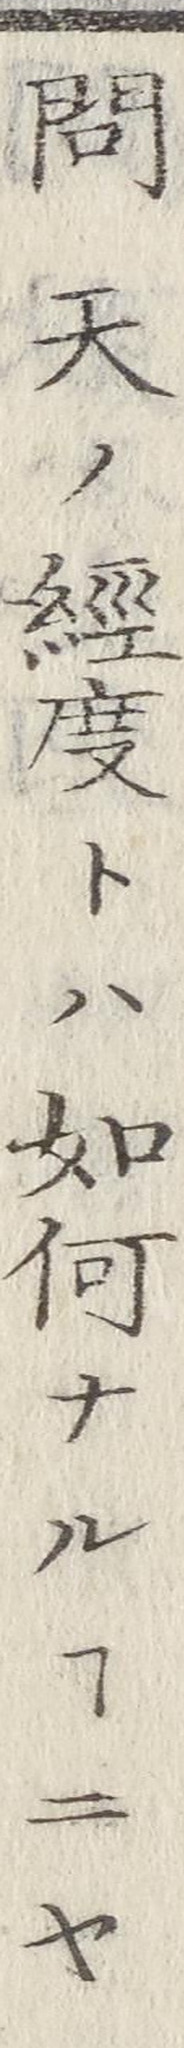問天ノ経度トハ如何ナルコトニヤ
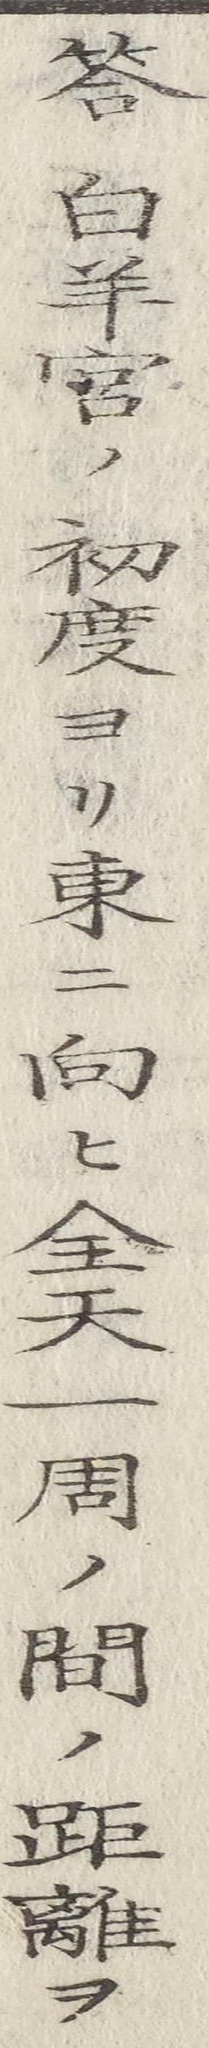答白羊宮ノ初度ヨリ東ニ向ヒ全天一周ノ間ノ距離ヲ
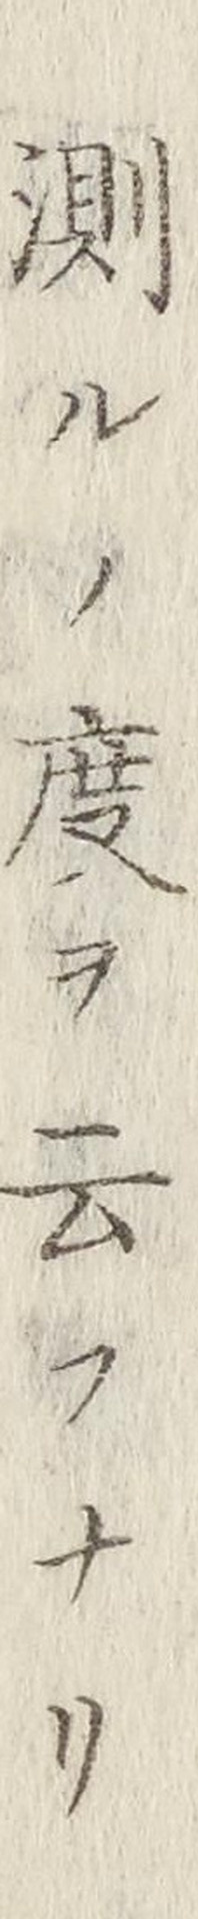測ルノ度ヲ云フナリ
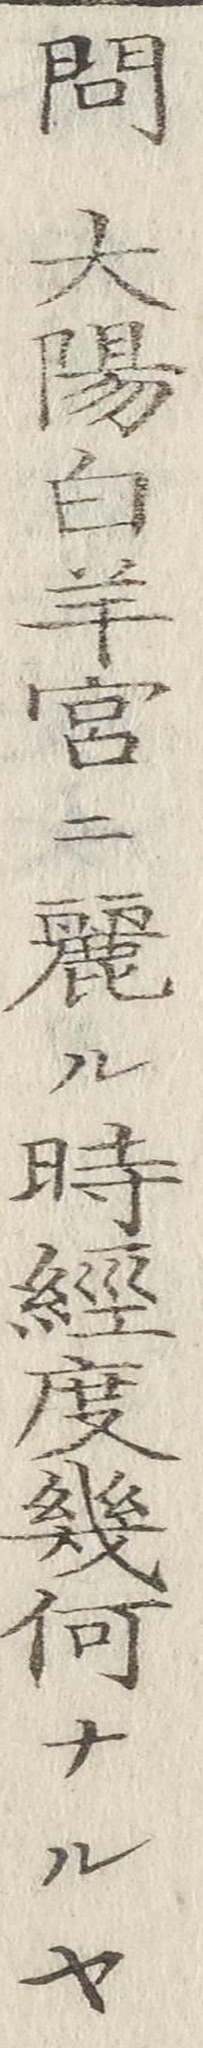問大陽白羊宮ニ麗ル時経度幾何ナルヤ
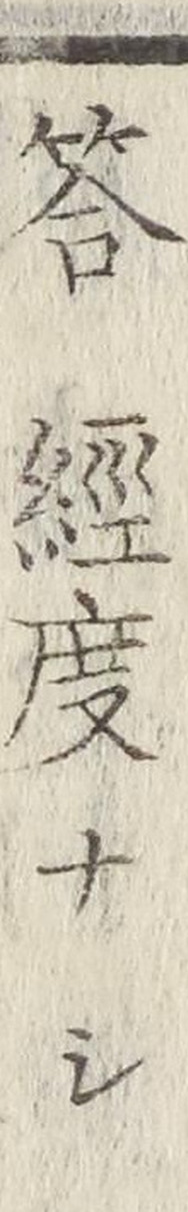答経度ナシ
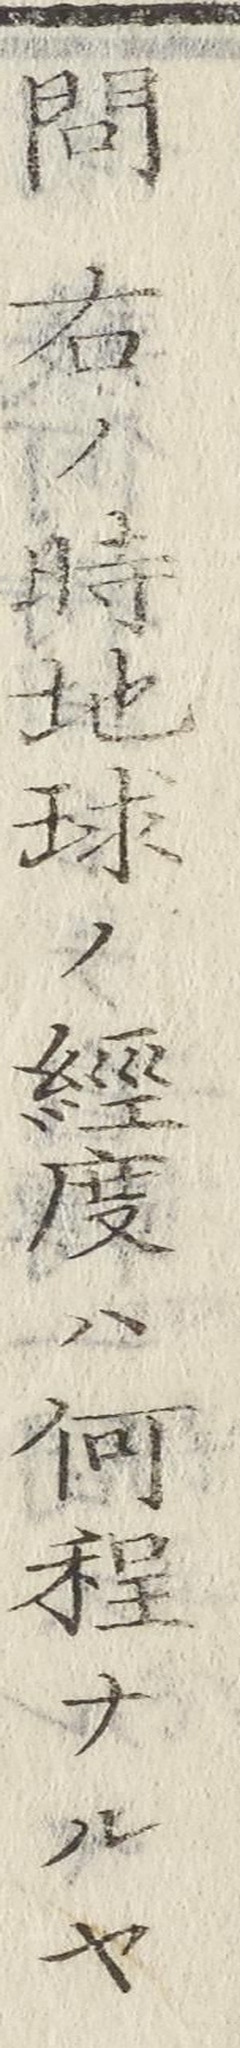問右ノ時地球ノ経度ハ何程ナルヤ
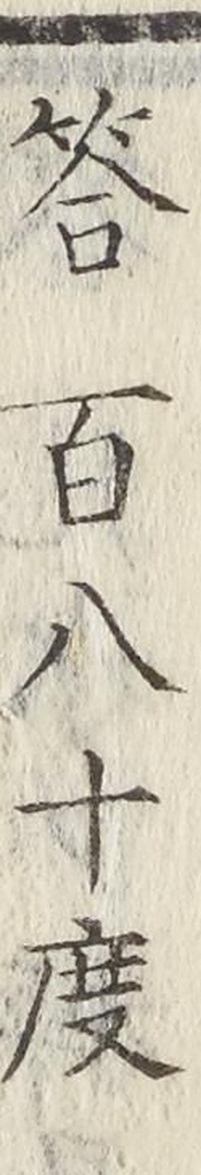答百八十度
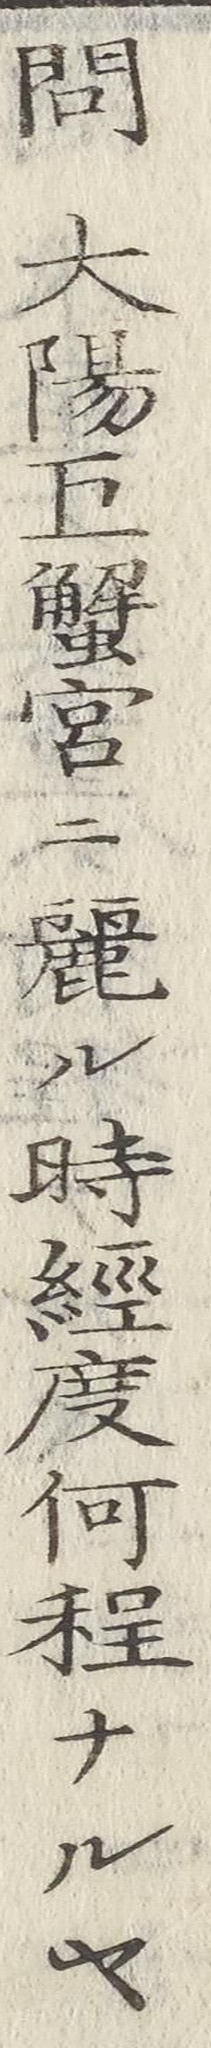問大陽巨蟹宮ニ麗ル時経度何程ナルヤ
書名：星学圖説　上
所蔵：東京大学地震研究所図書室 Earthquake Research Institute Library, The University of Tokyo, JAPAN
